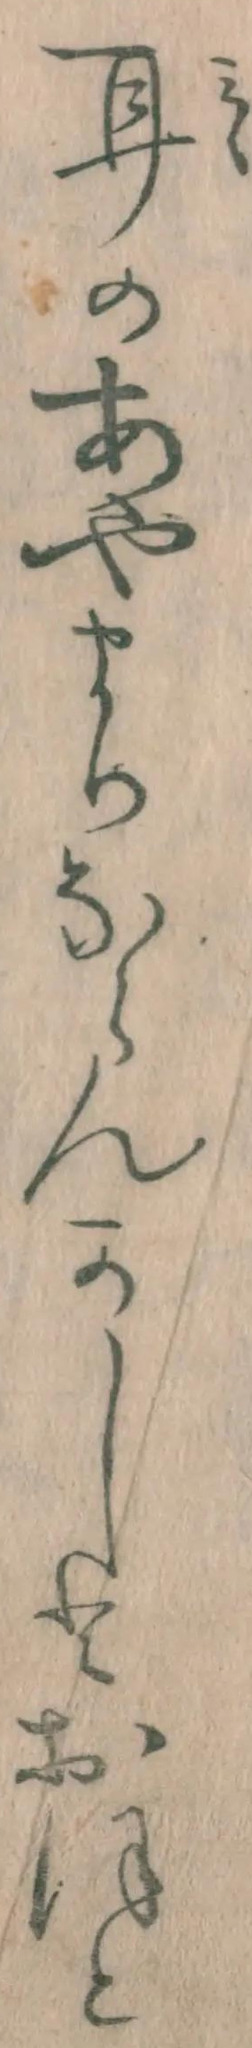耳のあやまりならんかしとおほこ？
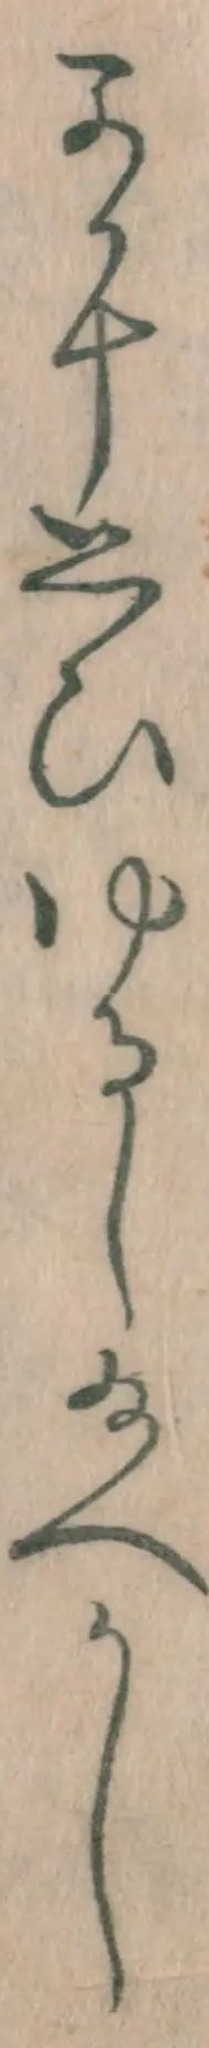かに？思ひゆるし給へかし
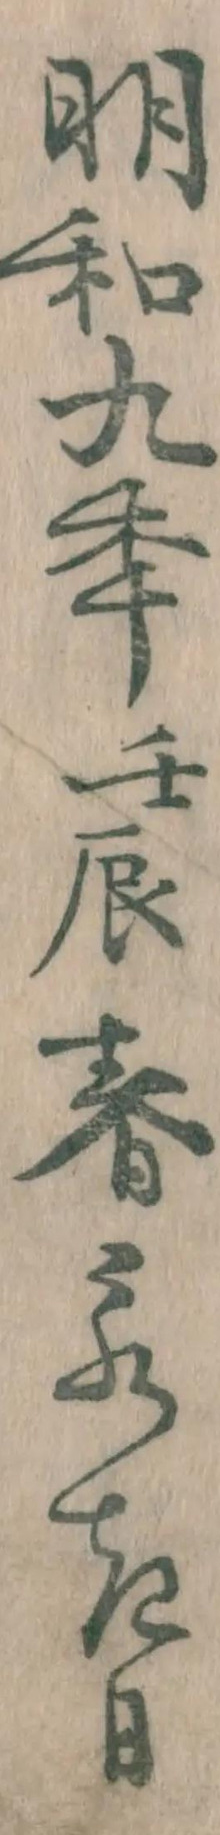明和九年壬辰春き日

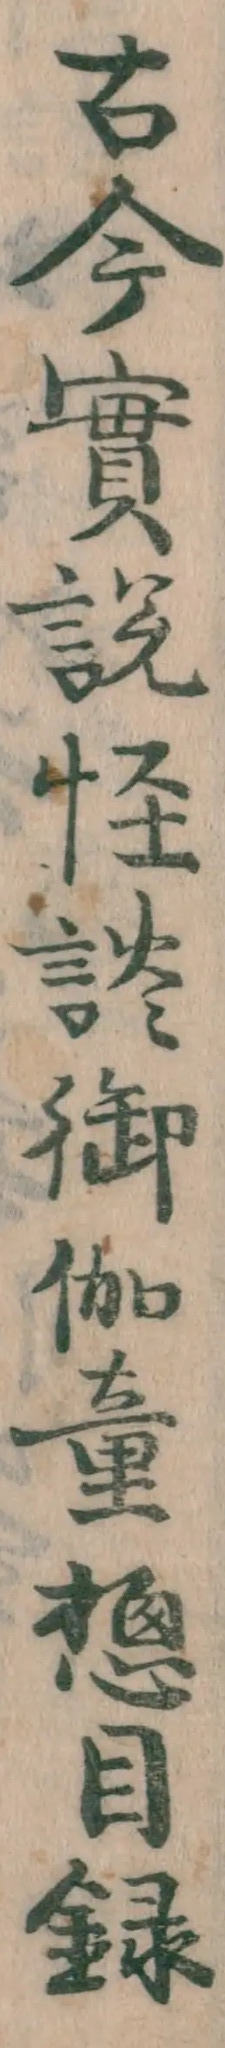古今実説怪談御伽童総目録
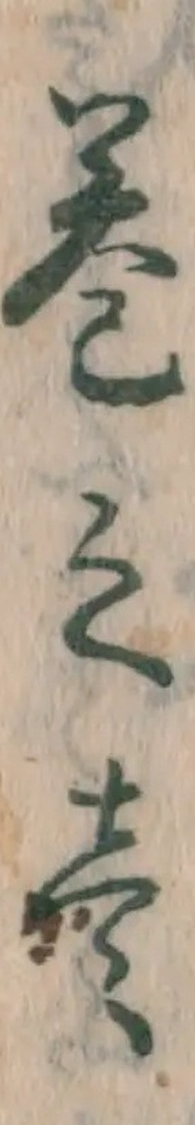巻の壱
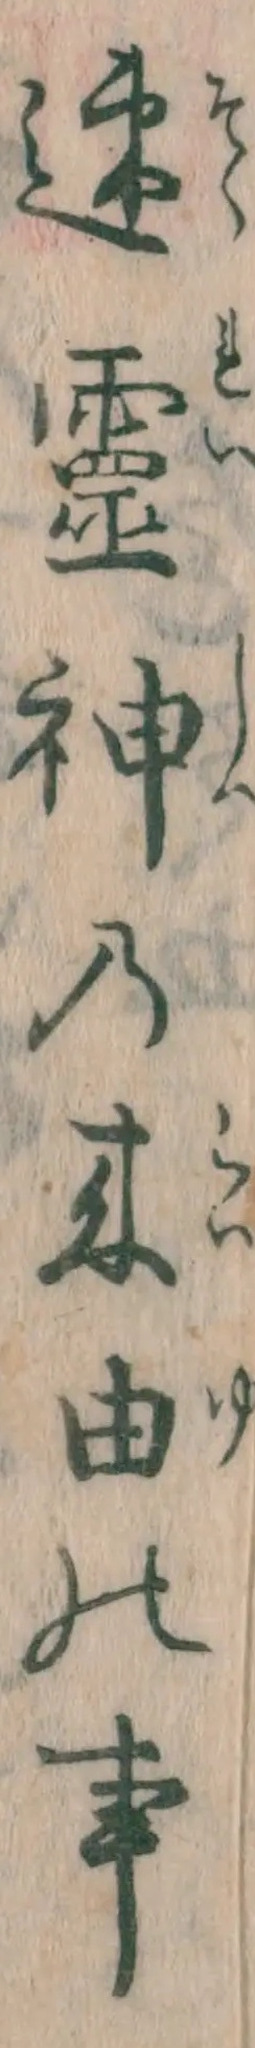速霊神の来由の事
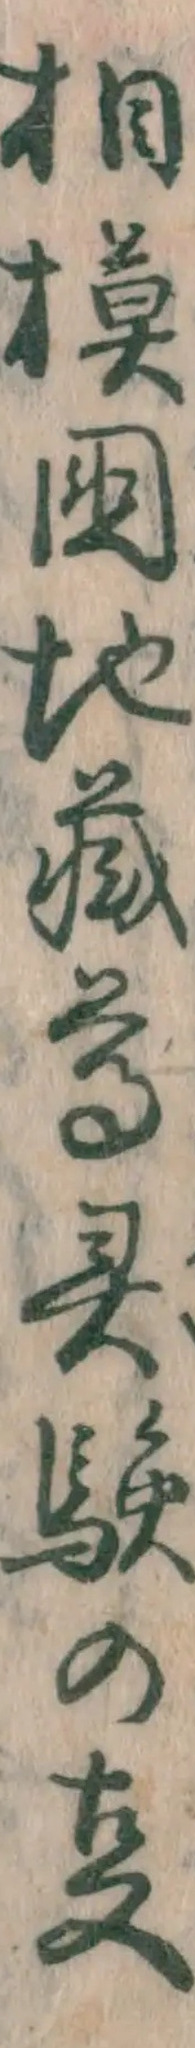相模国地蔵尊霊験の事
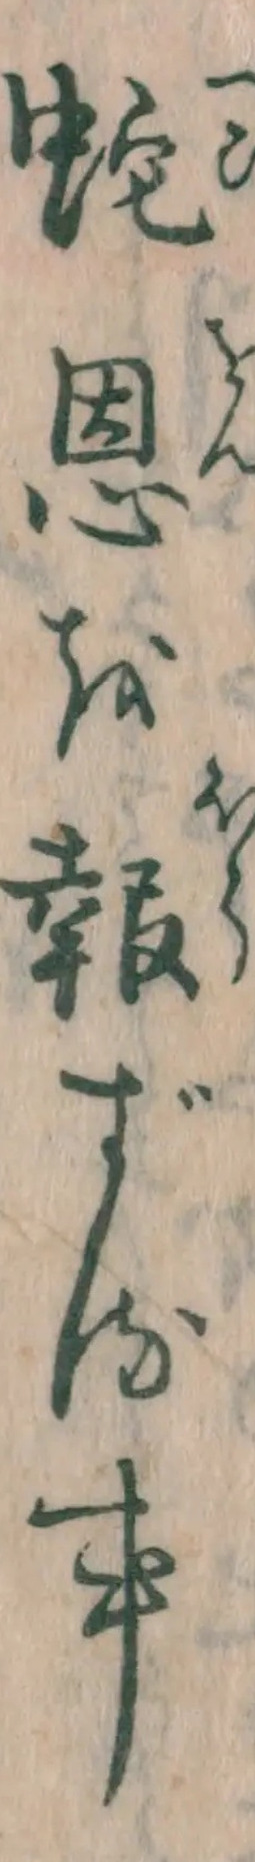蛇恩を報ずる事
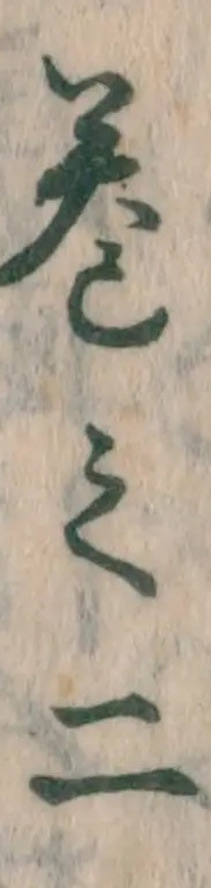巻の二
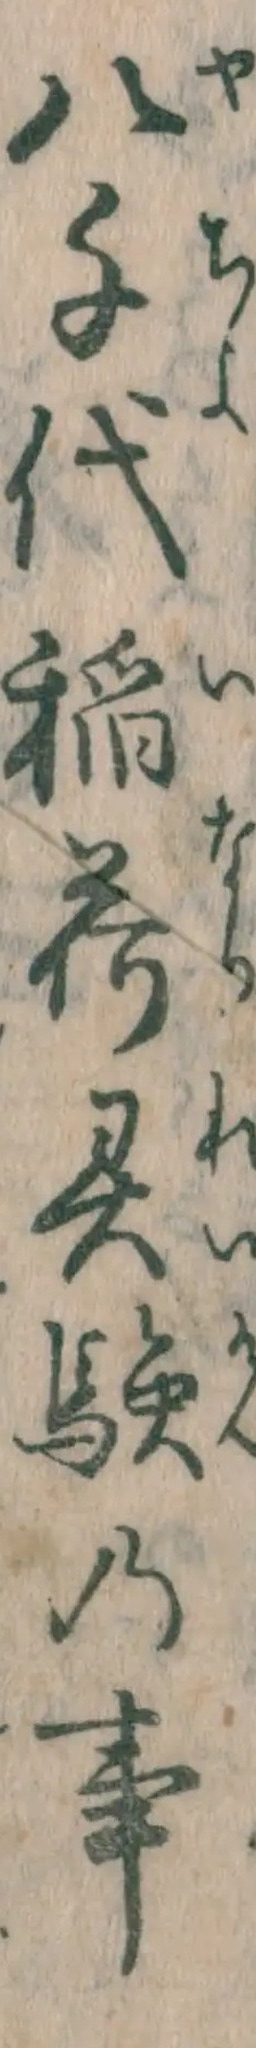八千代稲荷霊験の事
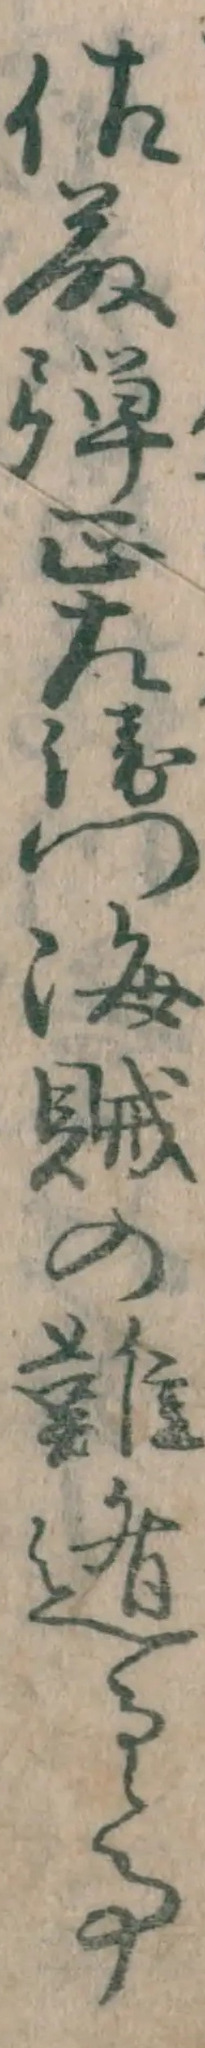佐藤弾正左衛門海賊の難遁るゝ事

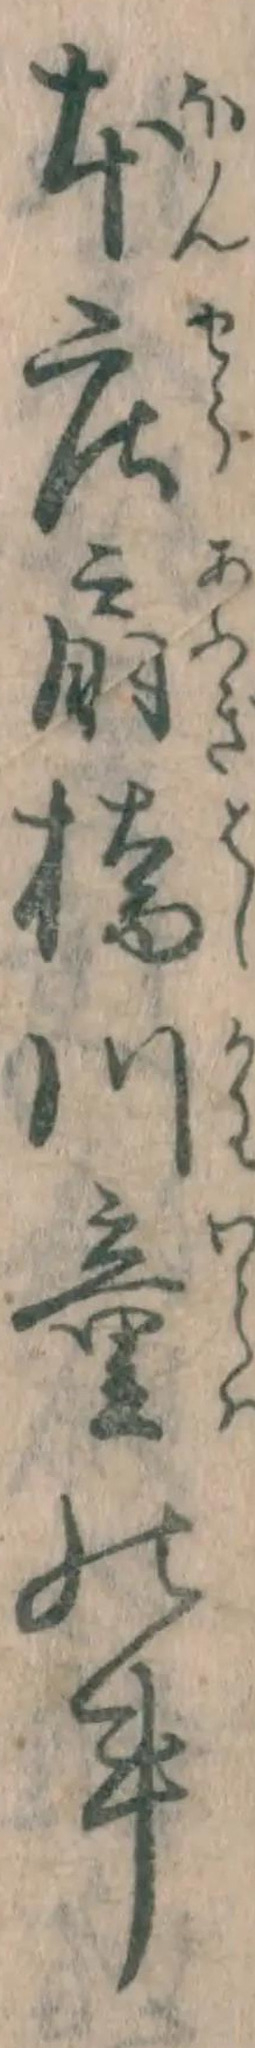本所扇橋川童の事
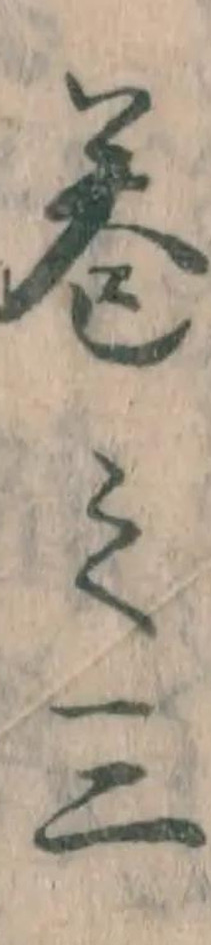巻の三
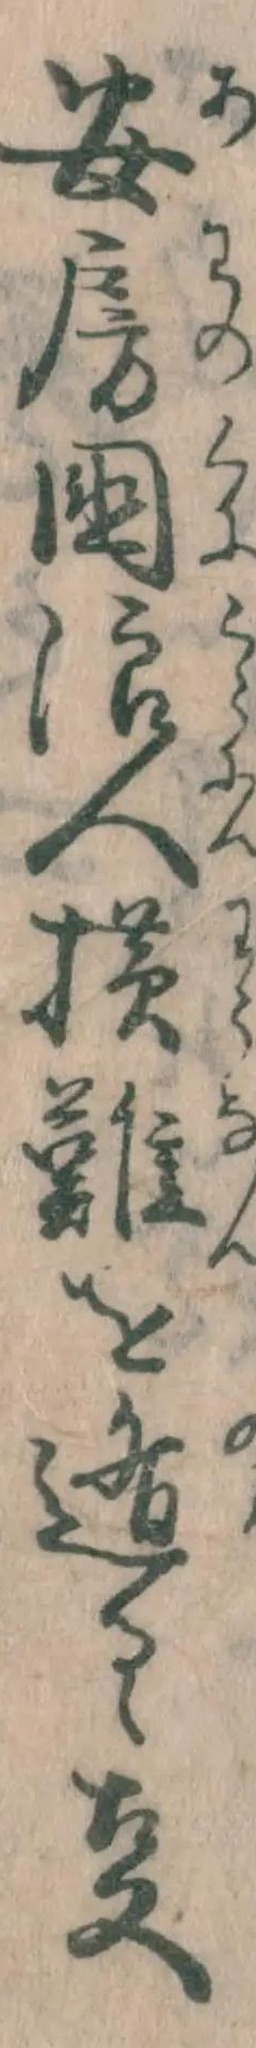安房国浪人横難を遁るゝ事
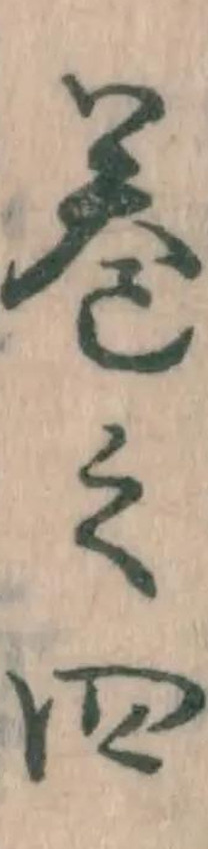巻の四
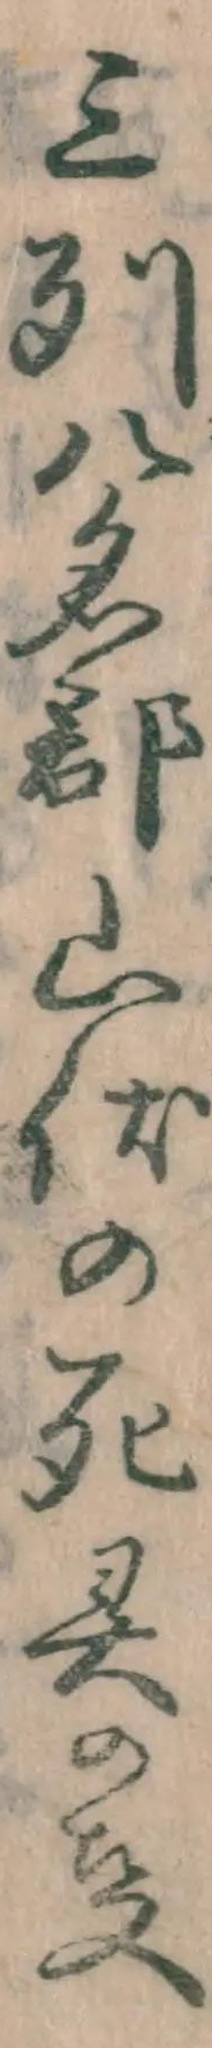三州八名郡山伏の死霊の事
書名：怪談御伽童 5巻. [1]
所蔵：国立国会図書館 National Diet Library, JAPAN
